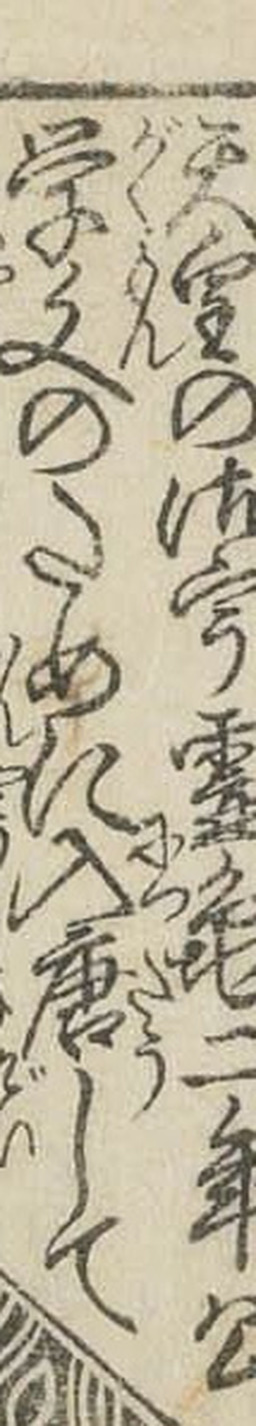学文のために入唐して
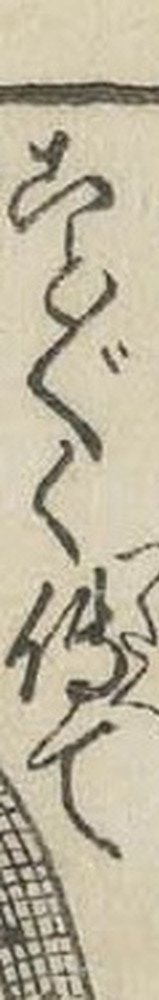こと〴〵く伝て
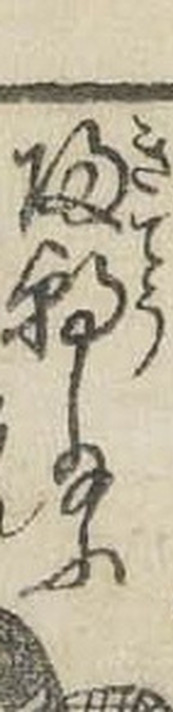帰朝し給ふ
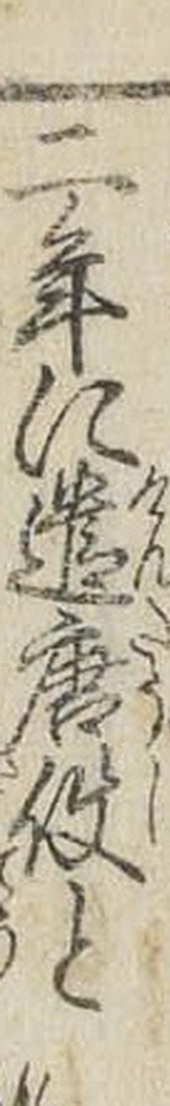二年に遣唐使と
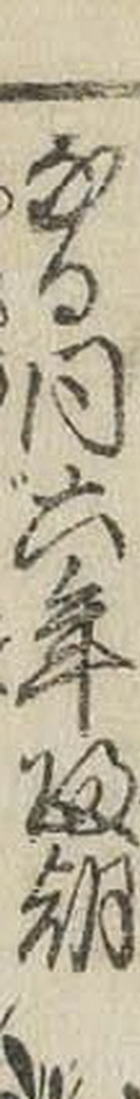なる同六年帰朝
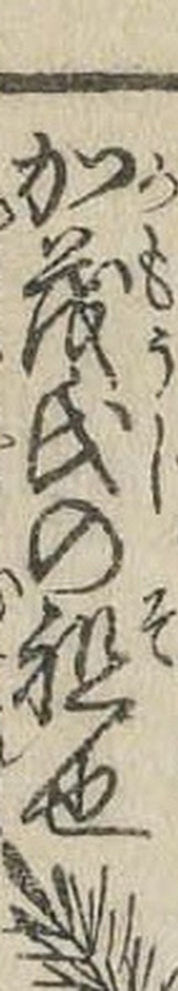加茂氏の祖也
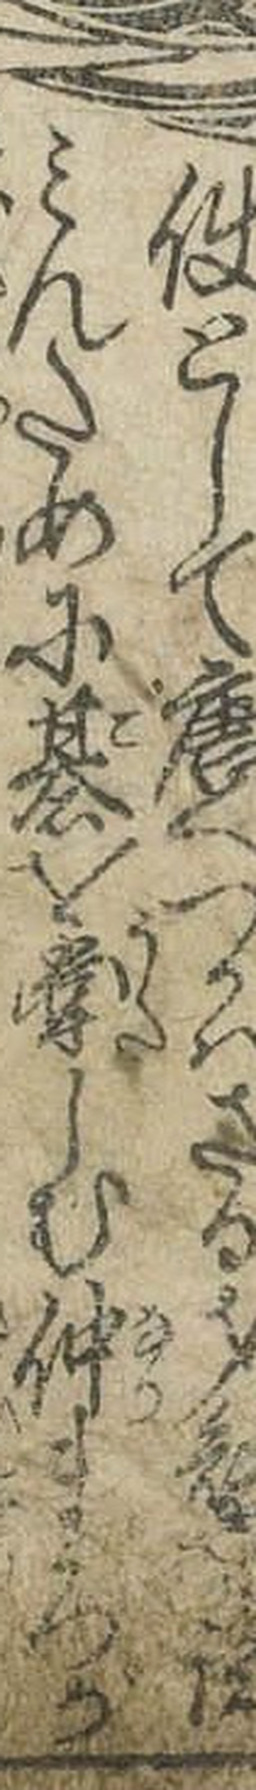みんために碁を囲しむ仲まろが
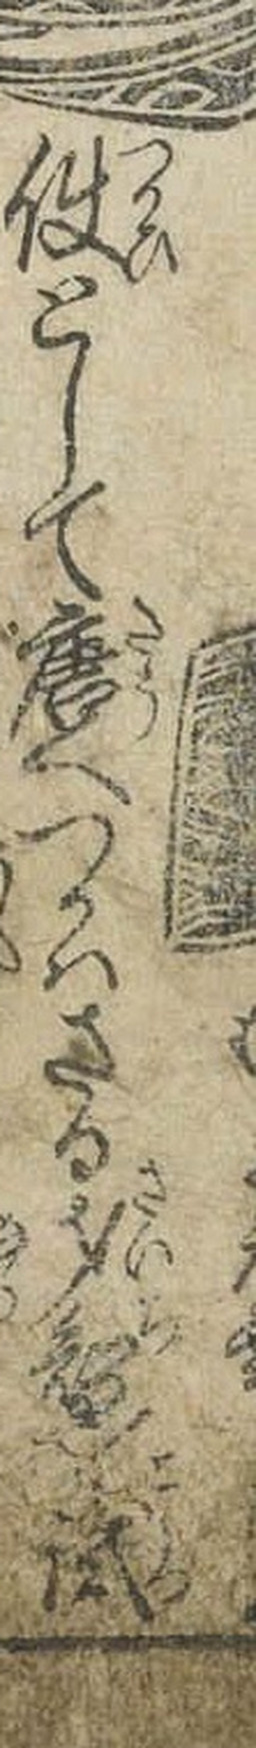使として唐へつかはさる才智を試
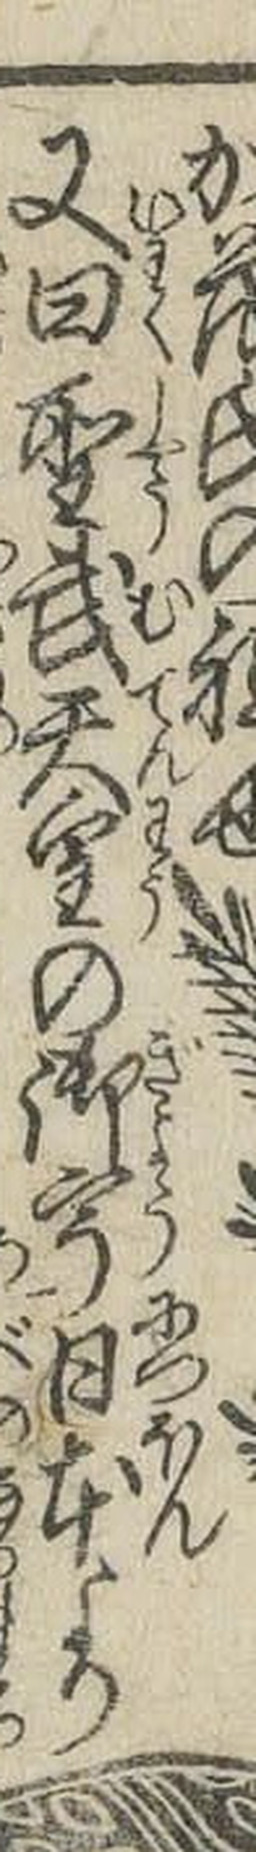又曰聖武天皇の御宇日本より
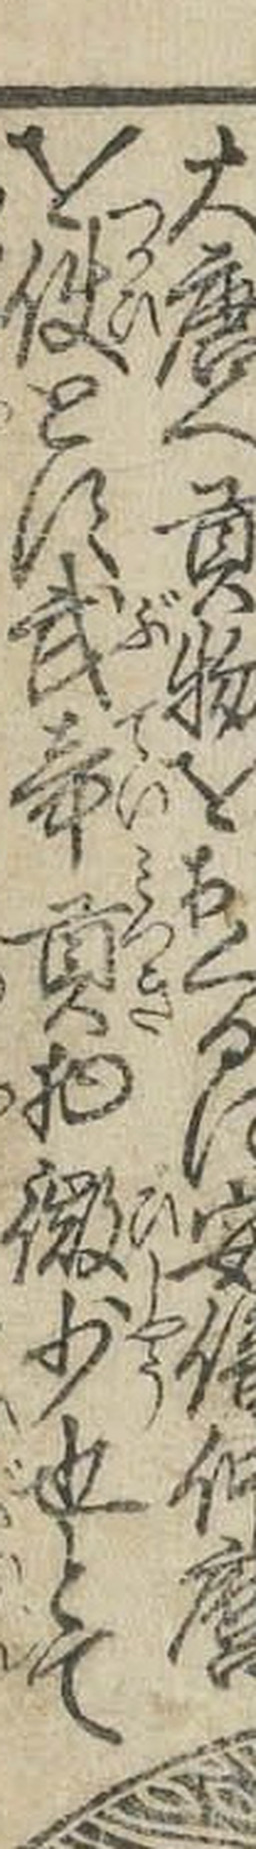を使とす武帝貢物微少也とて
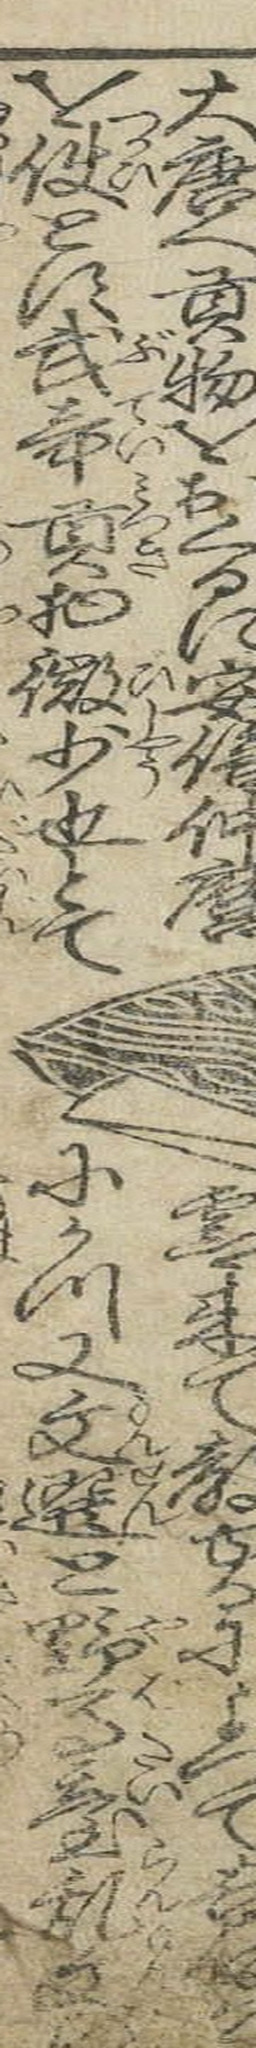を使とす武帝貢物微少也とて
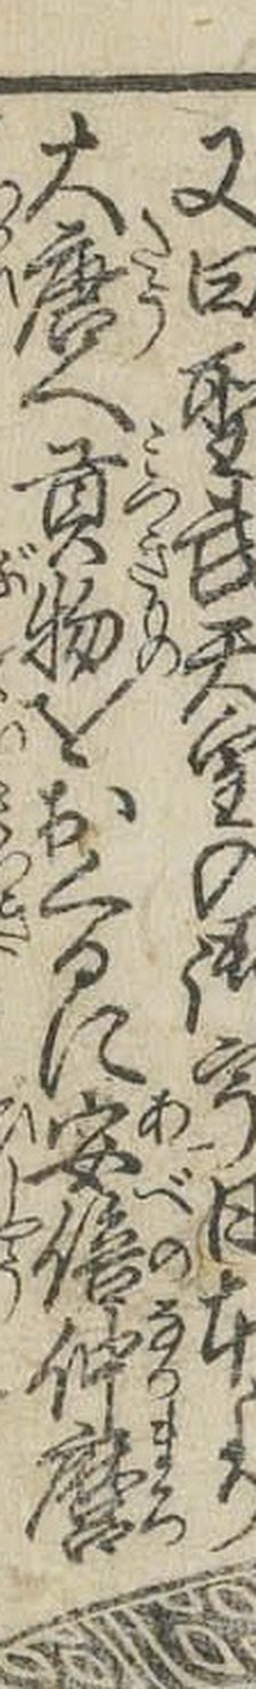大唐へ貢物をおくるに安倍仲麿
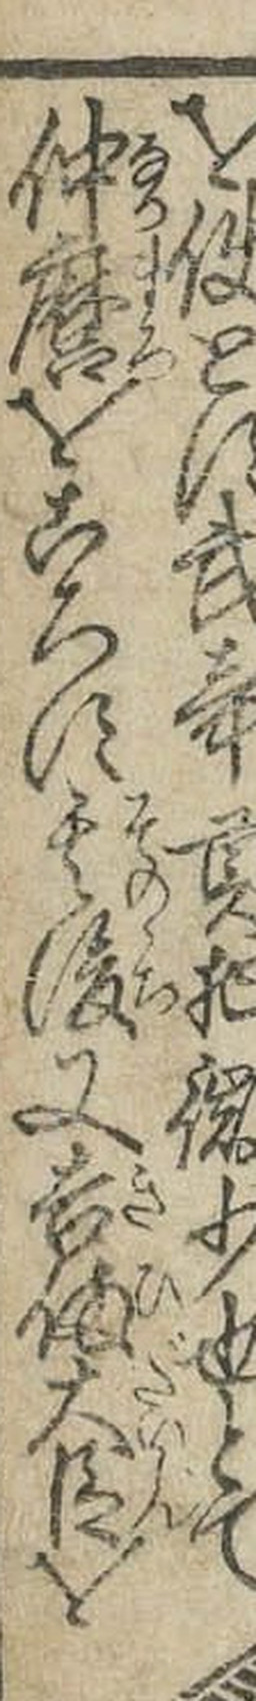仲麿をころす其後又吉備大臣を
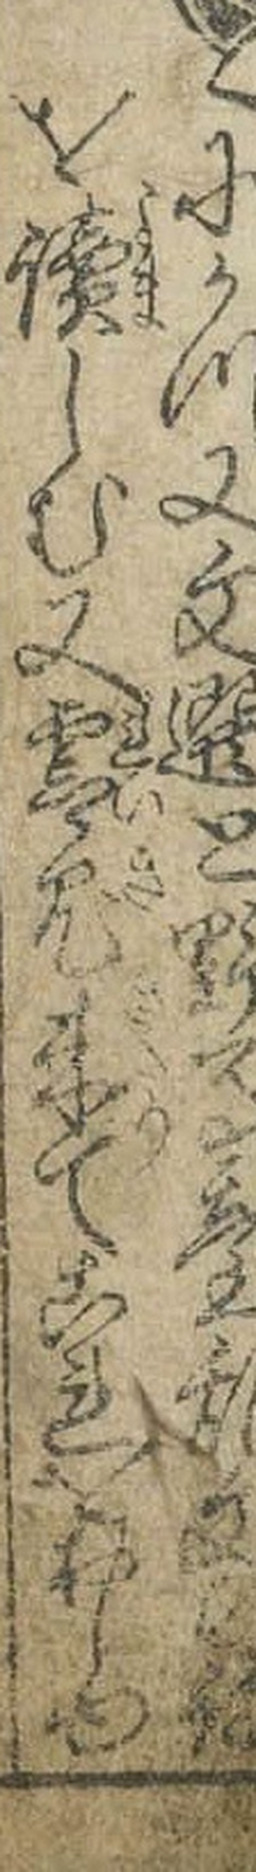を読しむ又霊鬼来てこれをおしゆ

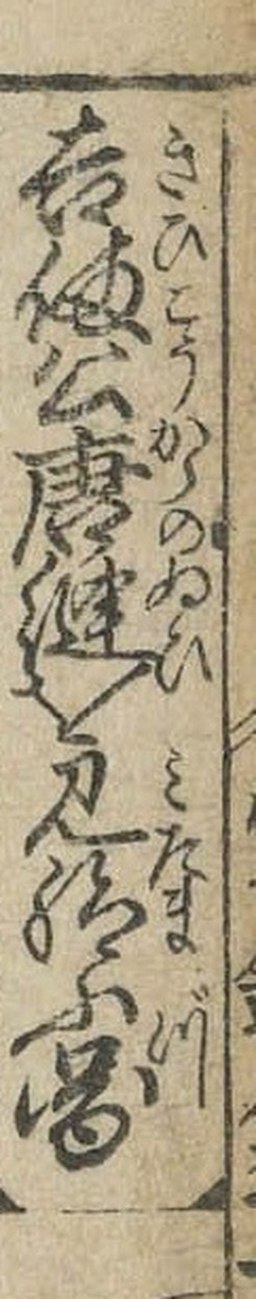吉備公唐縫を見給ふ図
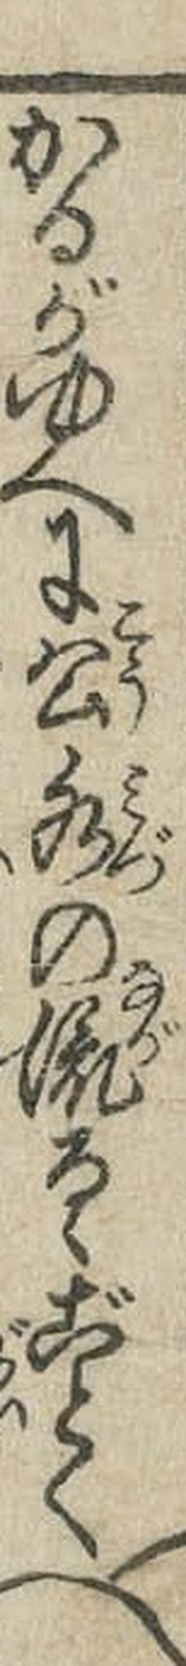かるがゆへに公水の流るゝごとく
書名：絵本写宝袋 9巻 1之巻
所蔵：東京学芸大学教育コンテンツアーカイブ
